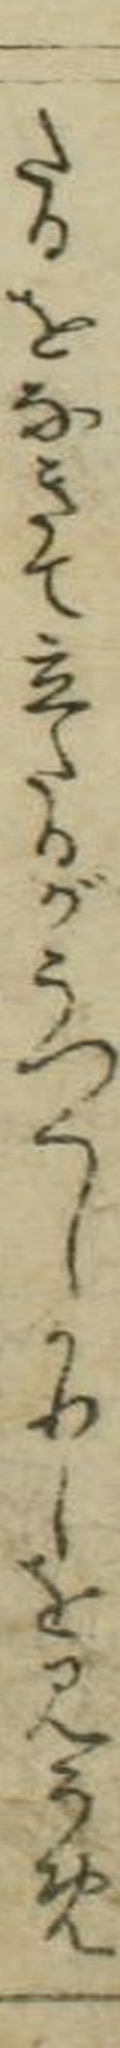たるをなきて立たるがうつくしかりしを見そめ
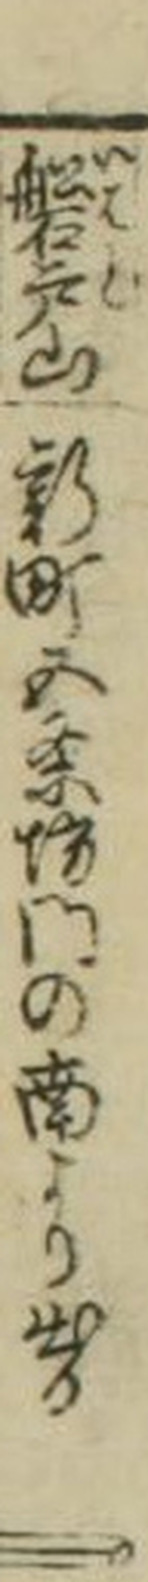磐戸山新町五条坊門の南より出る
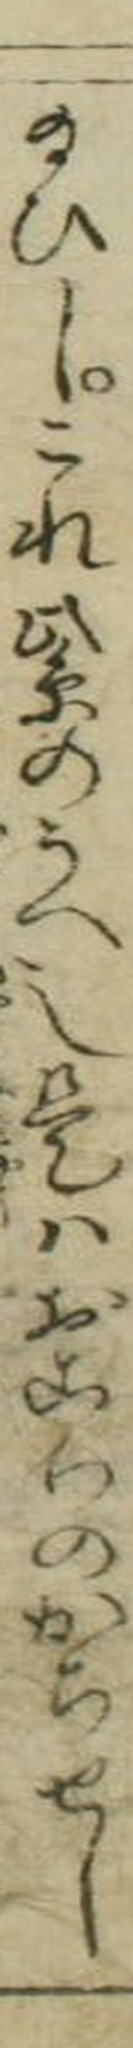給ひし。これ紫のうへ也是はおこりのかちせし
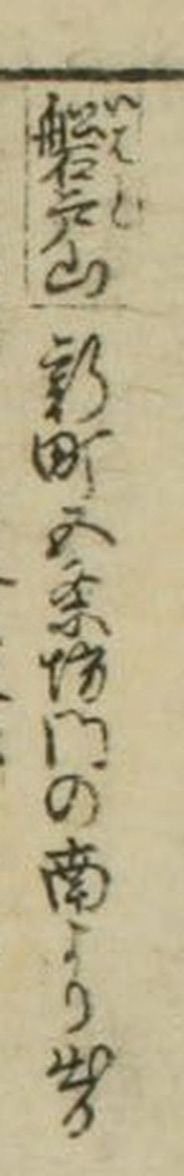磐戸山新町五条坊門の南より出る
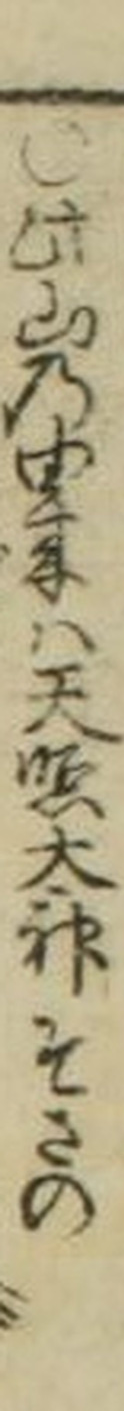◯此山の由来は天照太神そさの
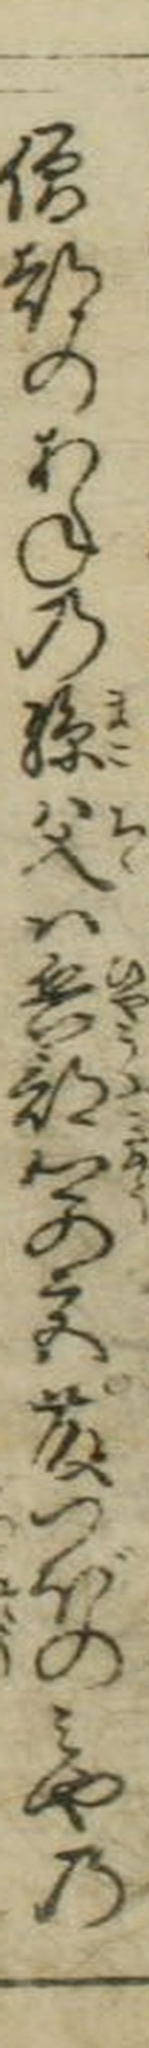僧都のあねの孫父は兵部卿の宮。藤つぼのみやの
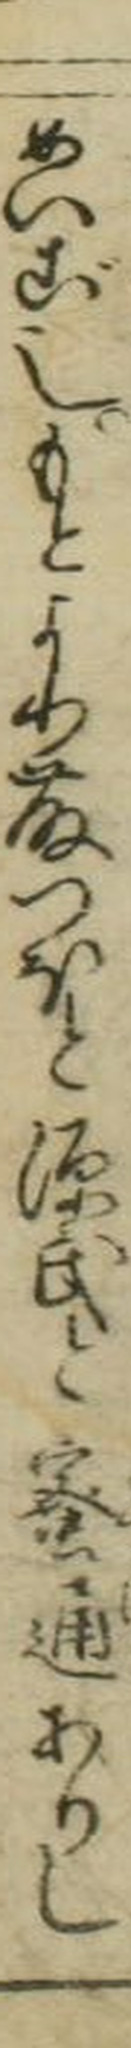めいご也。もとより藤つほと源氏と蜜通ありし
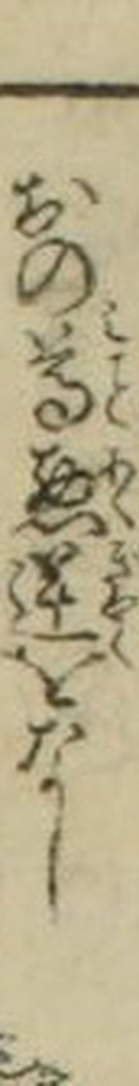おの尊悪逆をなし
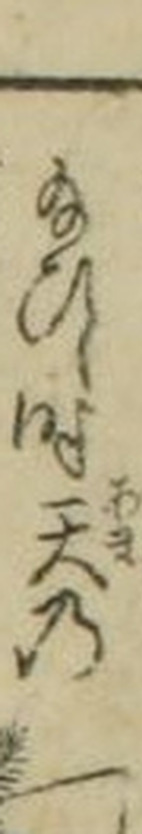給ひし時天の
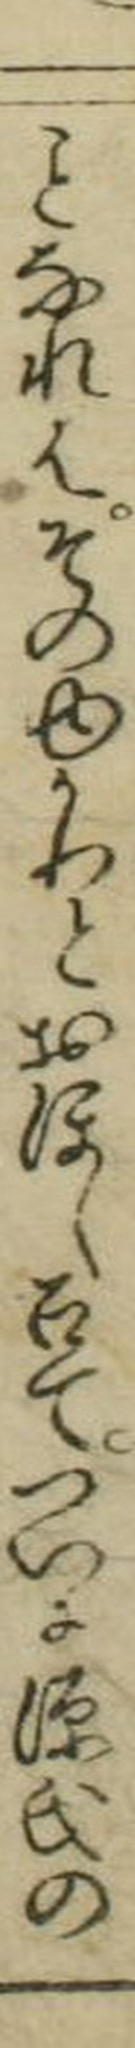ことなれは。そのゆかりとおほし召て。ついに源氏の
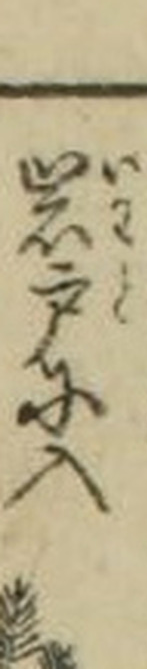岩戸に入
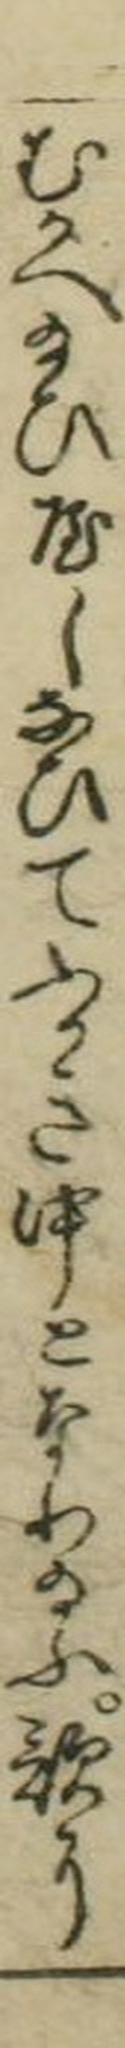むかへ給ひやしなひてふかき中となり給ふ。歌に
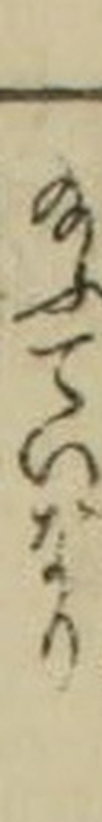給ふていなり
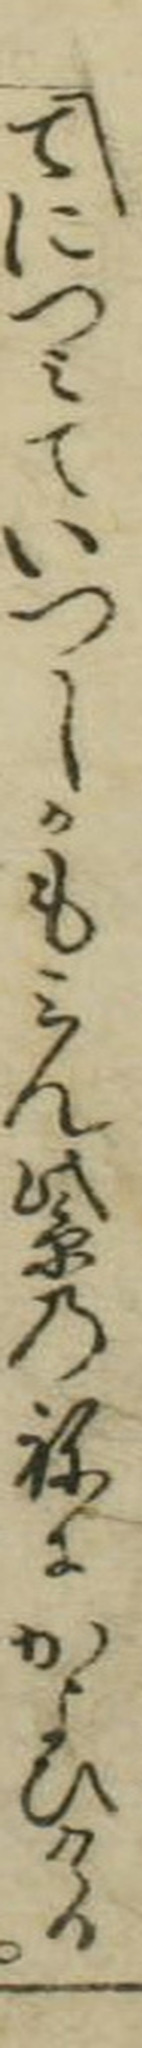〽てにつみていつしかもみん紫のねにかよひける
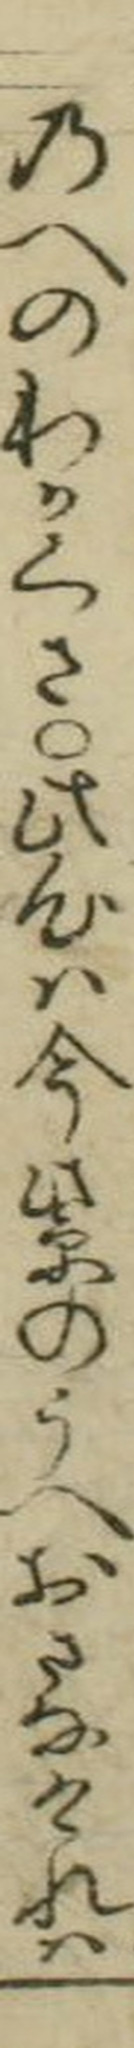のへのわかくさ◯此心は今紫のうへおさなけれは。
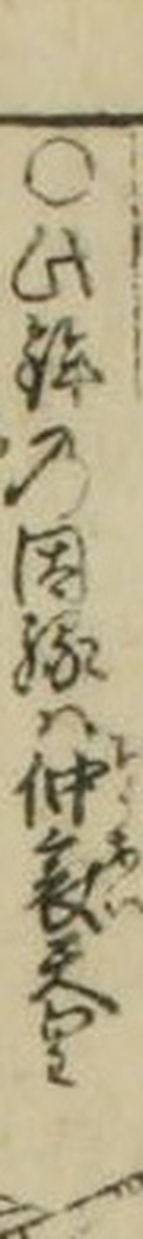◯此鉾の因縁は仲哀天皇
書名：女源氏教訓鑑
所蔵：東京学芸大学附属図書館
